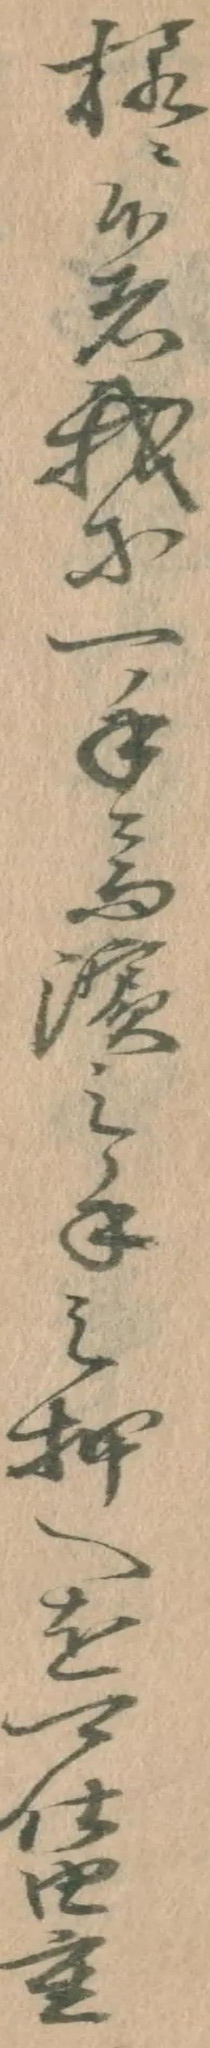様に候者我等一手に而浜之手之押へを可仕由重
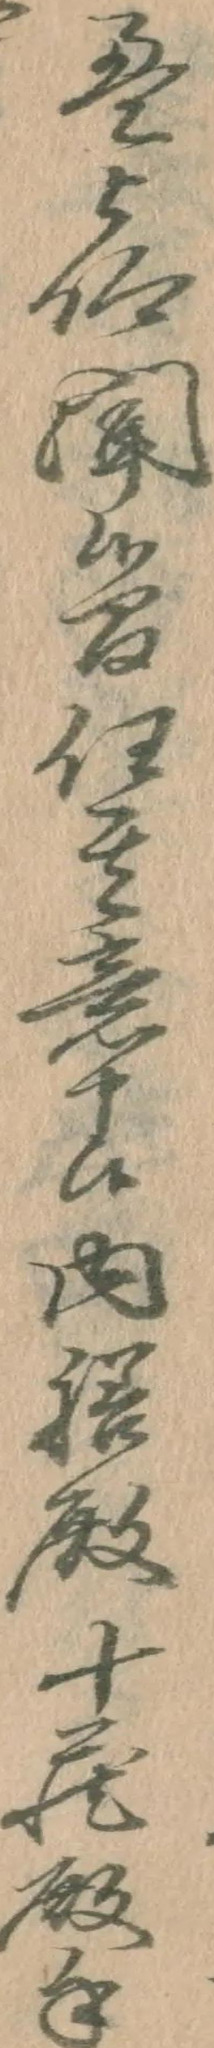畳被仰聞候間任其意申候内膳殿十蔵殿手
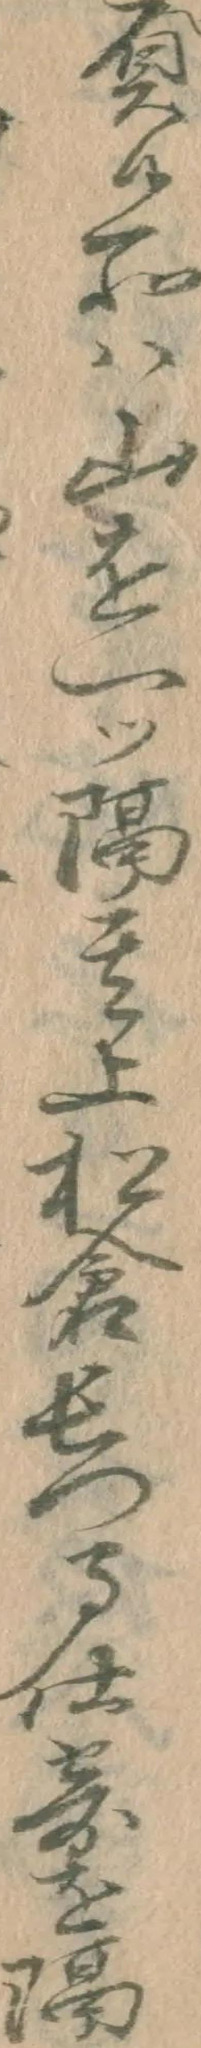に負候所は山を一つ隔其上松倉長門守仕寄を隔
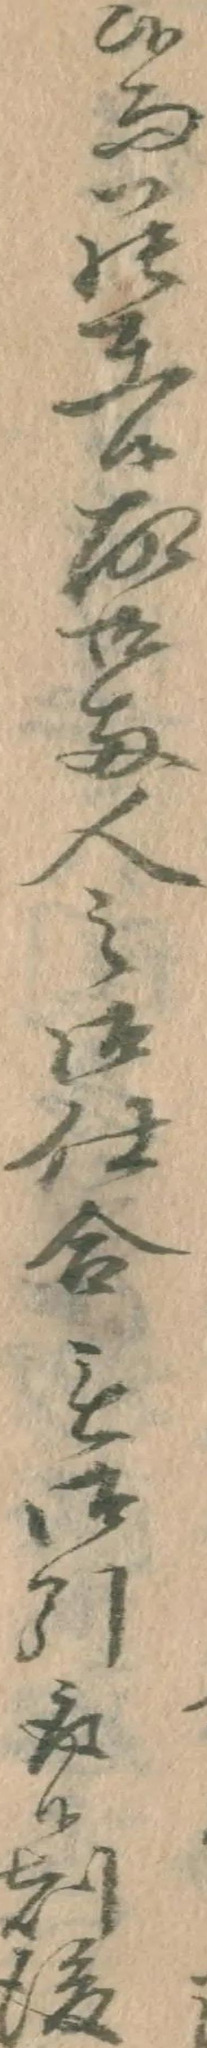候而罷在候故御両人之御仕合も御引取候刻後
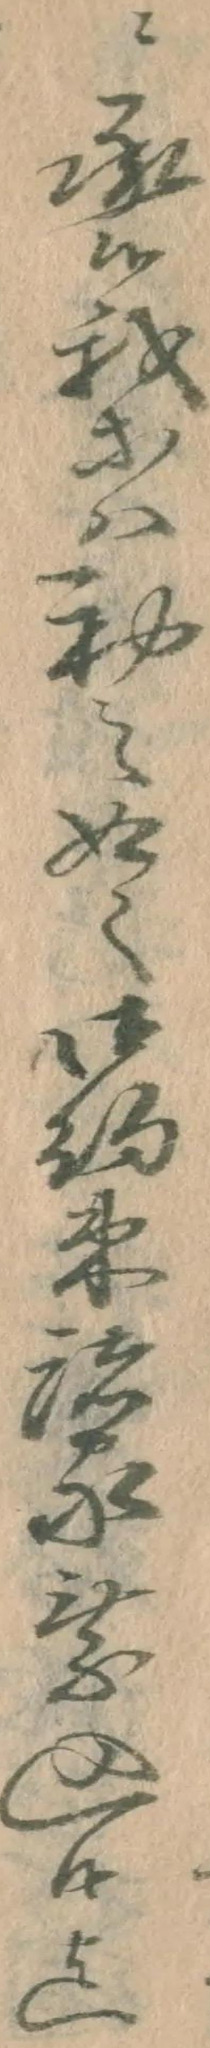に承候我等は初之如く御約束諸家乗込候迄
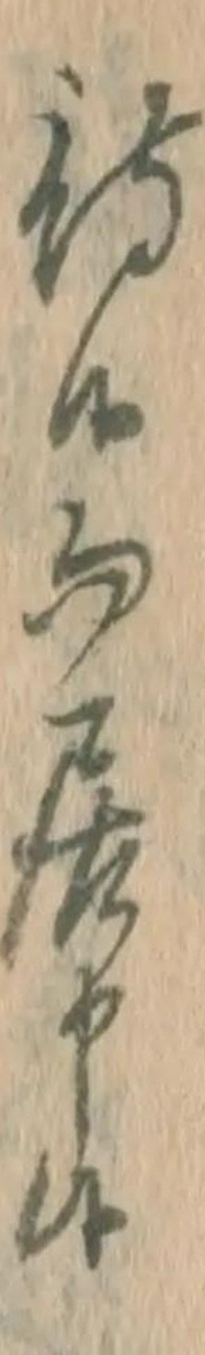待候而居申候
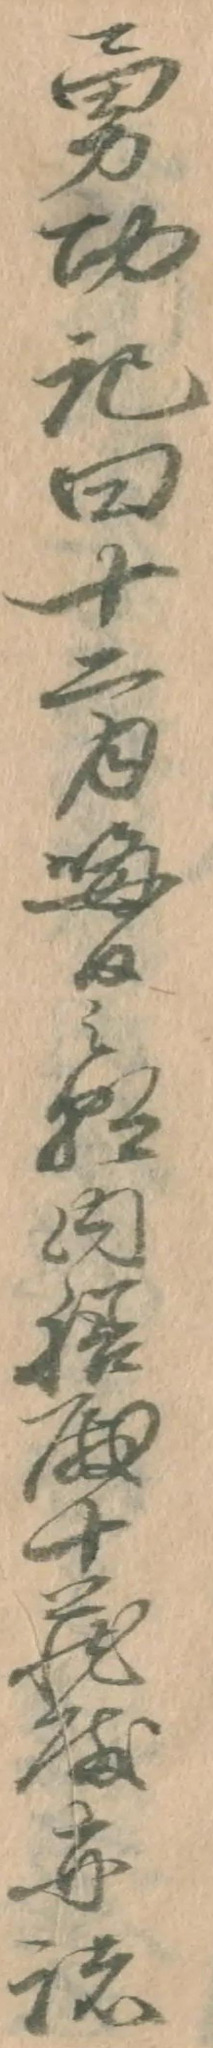勇功記曰十二月晦日之朝内膳殿十蔵殿亦諸

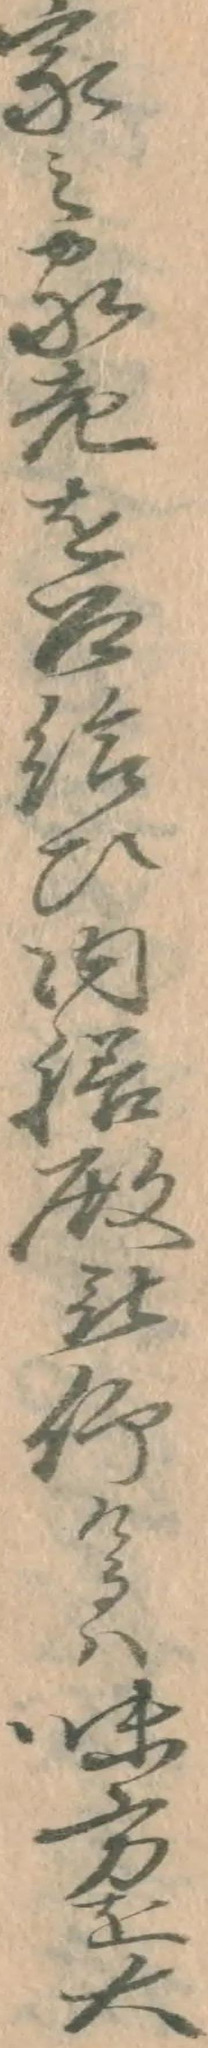家之家老を召給ひ内膳殿被仰けるは味方を大
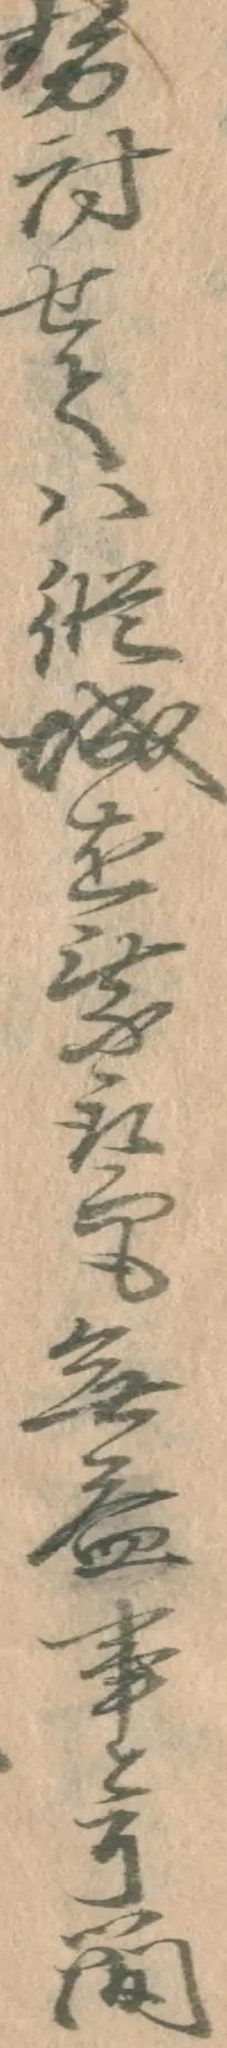勢討せては縦城を乗取而も無益事と了簡
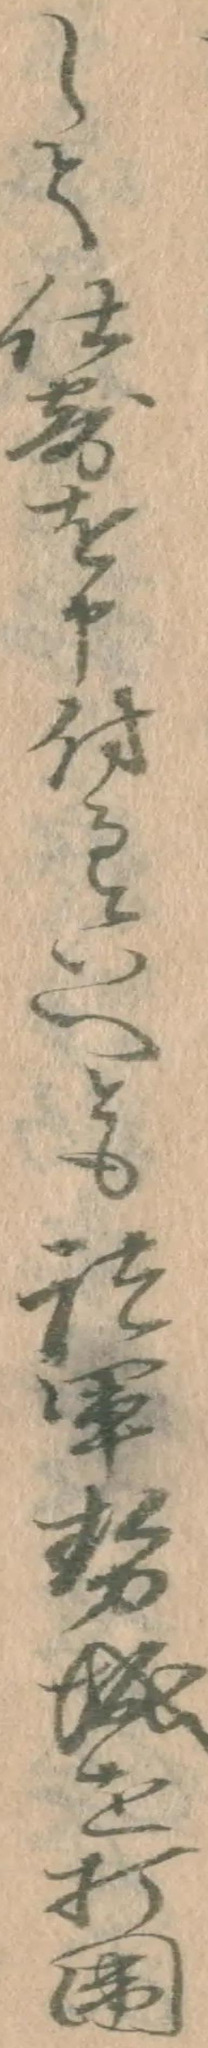して仕寄を申付るといへとも諸軍勢城を打囲
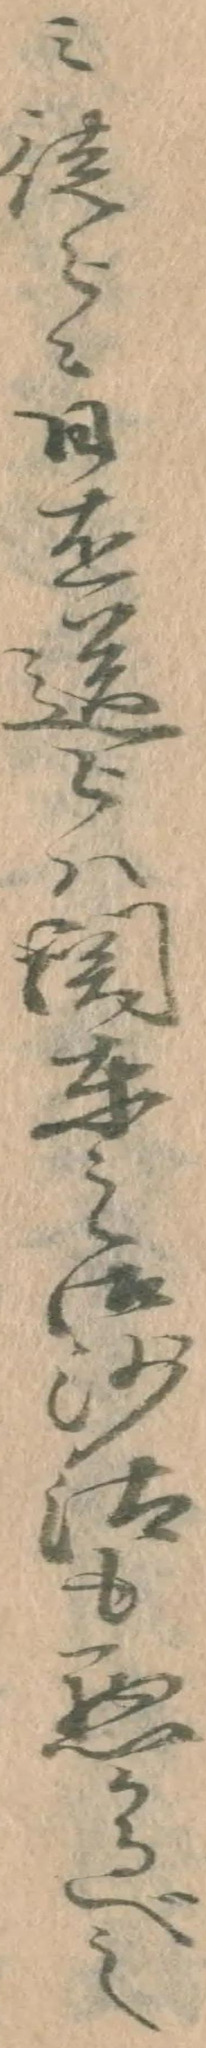み徒らと日を送らは関東之御沙汰も悪かるべし
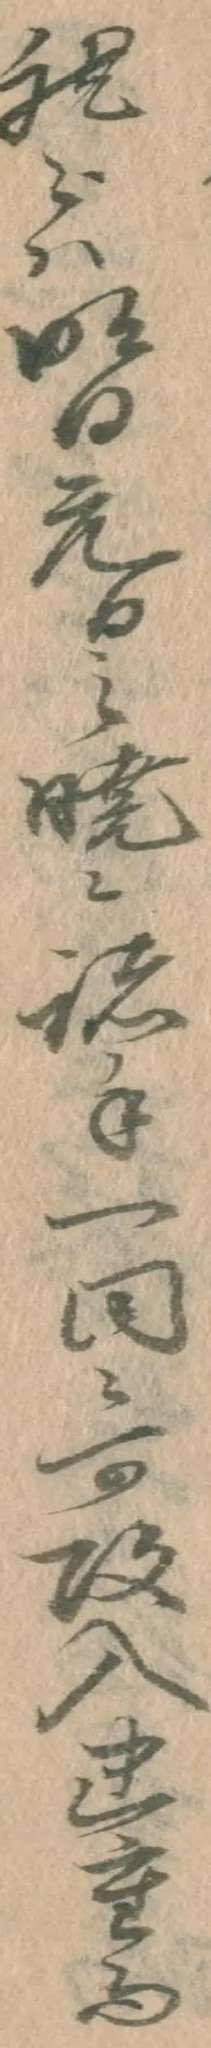然らは明日元日之暁に諸手一同に可攻入迚重而
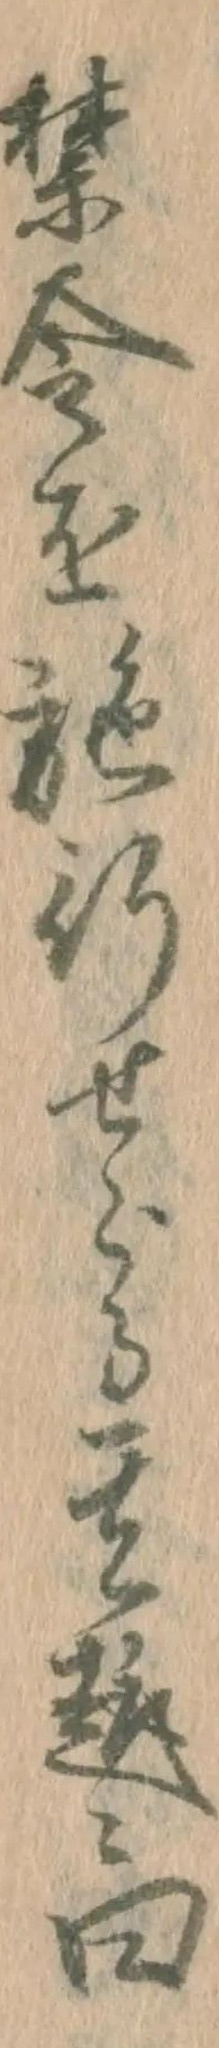禁令を施行せらる其趣に曰
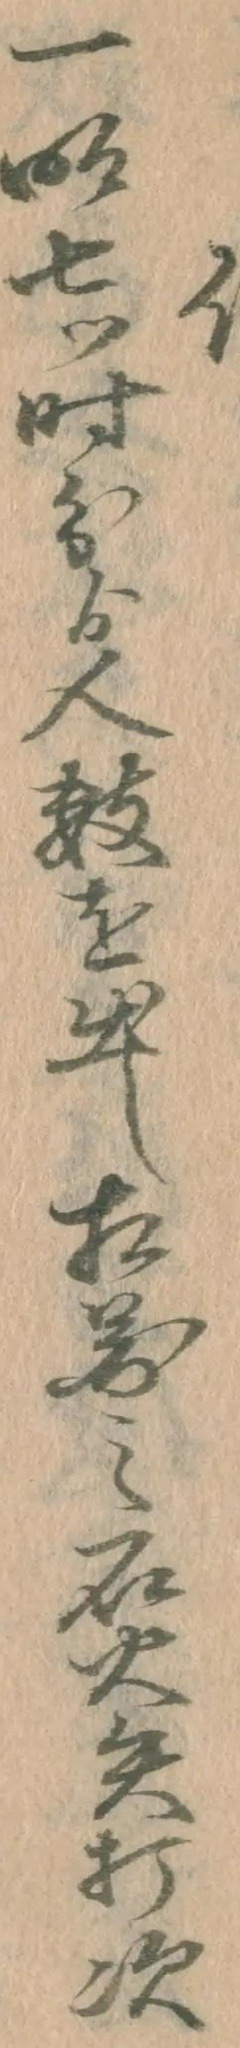一明七つ時分ゟ人数を出し相図之石火矢打次
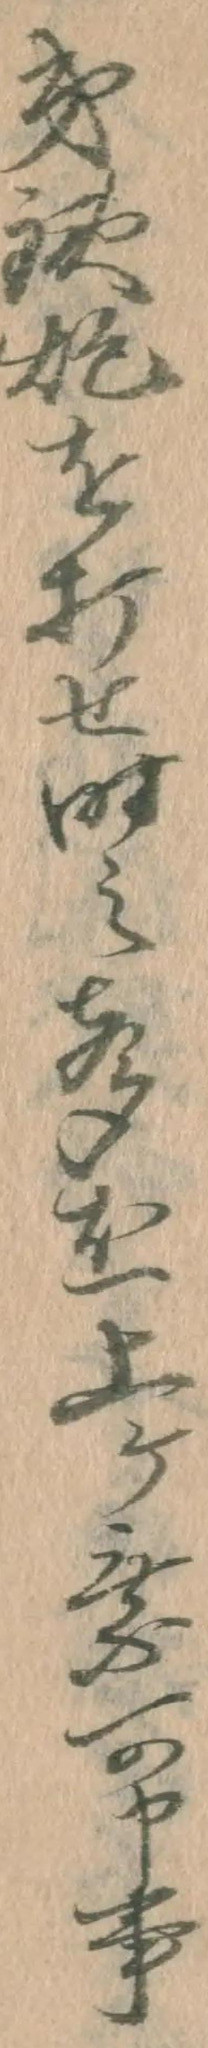第鉄炮を打せ時之声を上け乗可申事
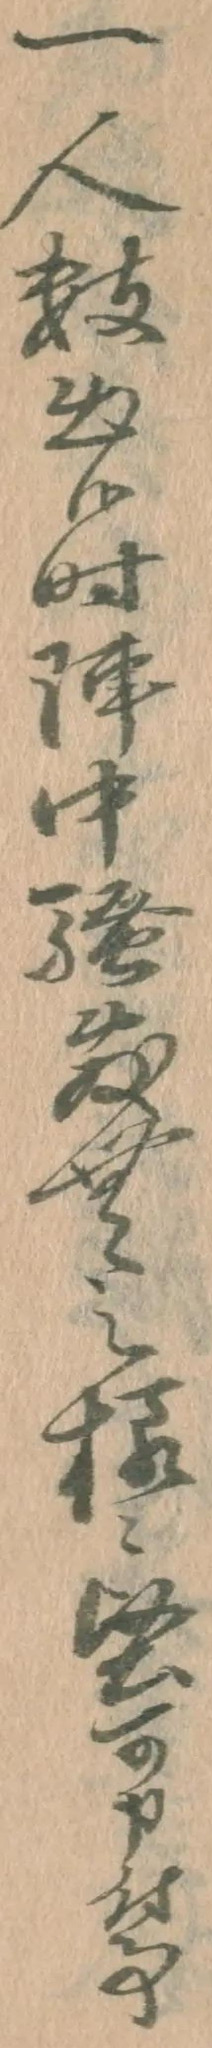一人数出候時陣中騒敷無之様に堅可申付事
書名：切支丹御退治記 49巻. [5]
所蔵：国立国会図書館 National Diet Library, JAPAN
